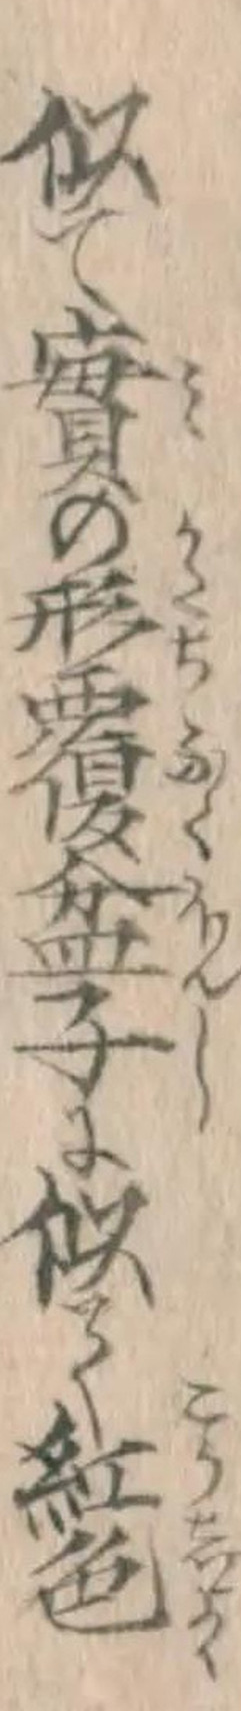似て実の形覆盆子に似て紅色
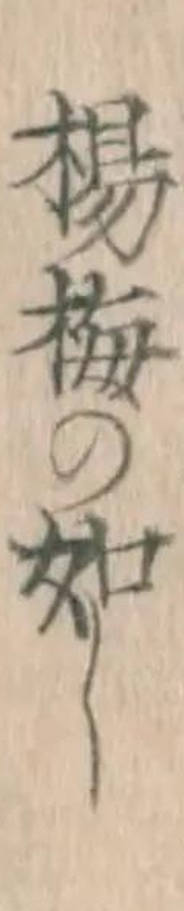楊梅の如し

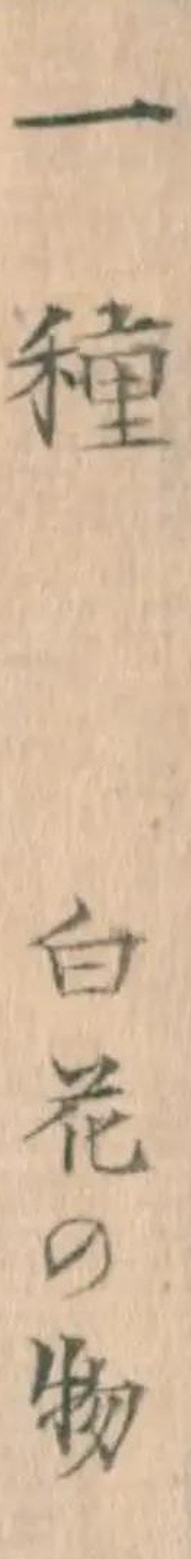一種白花の物
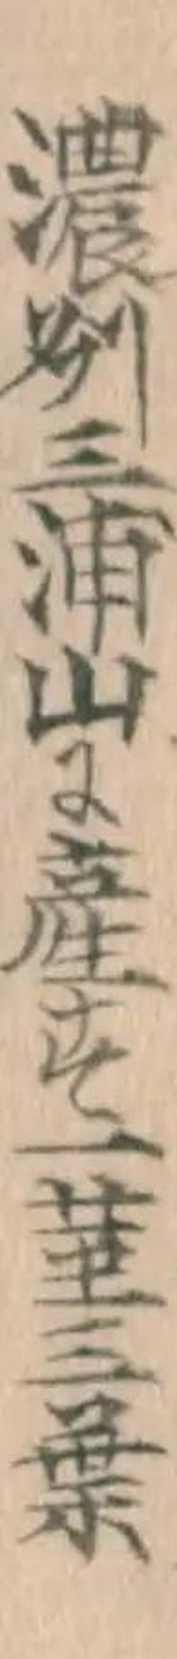濃州三浦山に産す一茎三葉
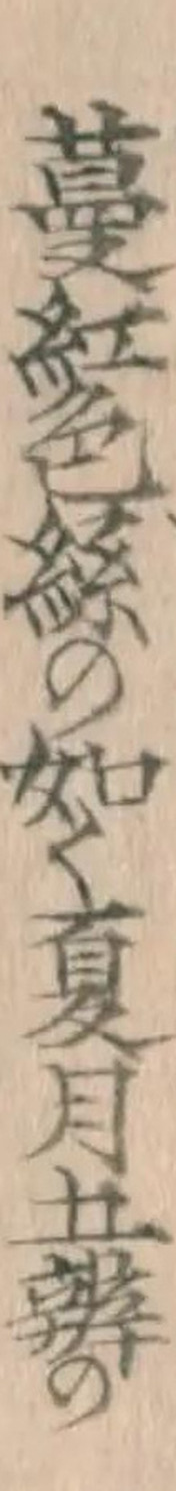蔓紅色糸の如く夏月五弁の
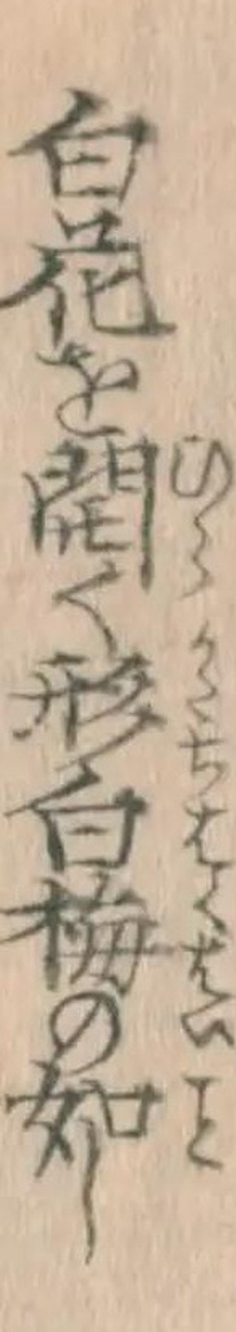白花を開く形白梅の如し
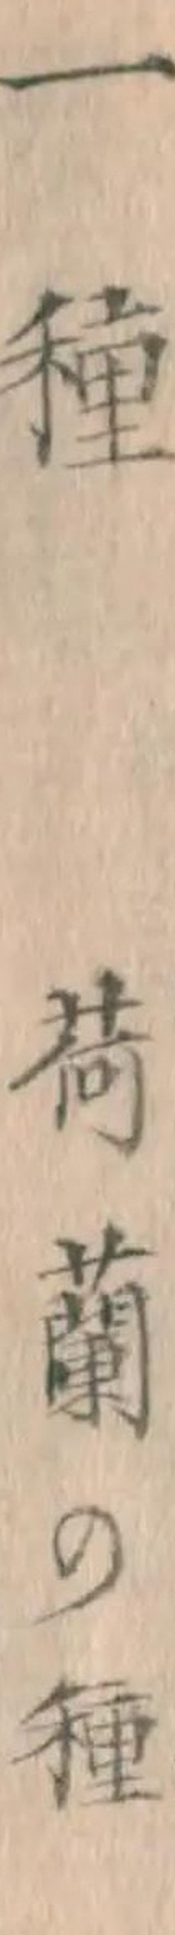一種荷蘭の種
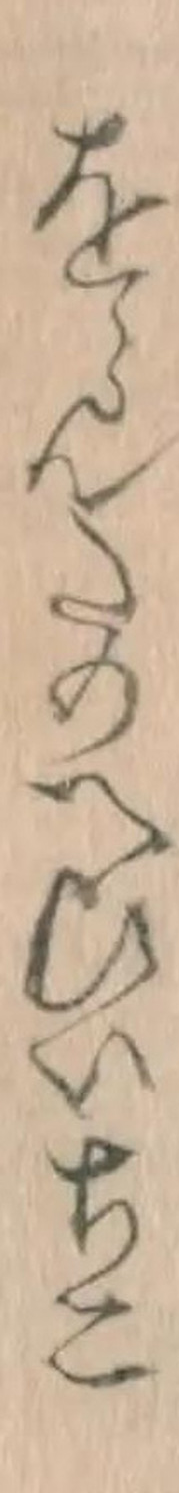をらんたのへひいちこ
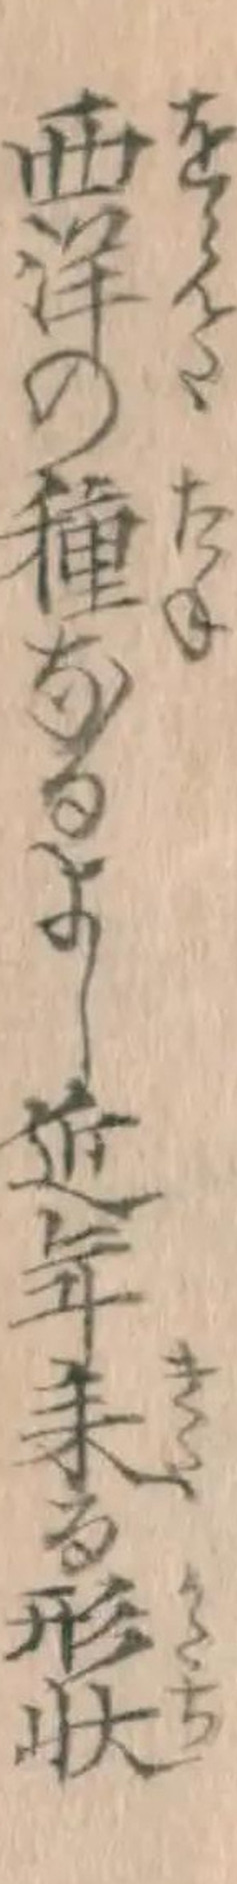西洋の種なるよし近年来る形状
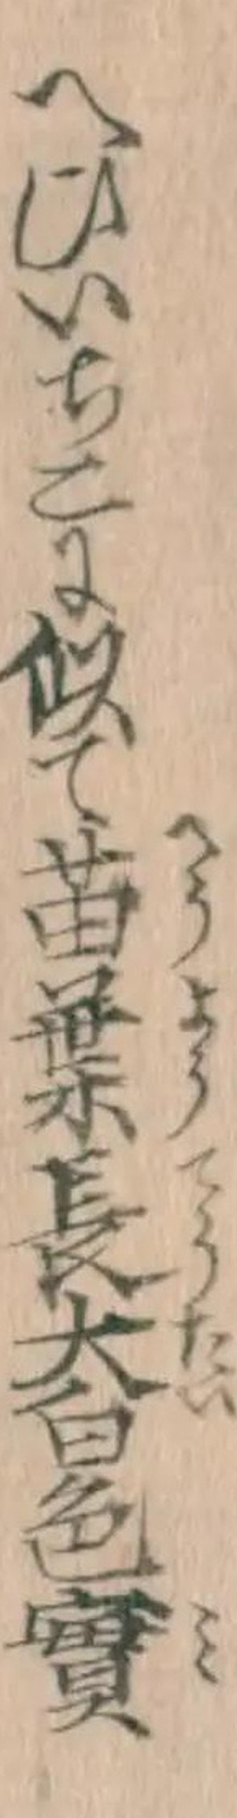へひいちこに似て苗葉長大白色実
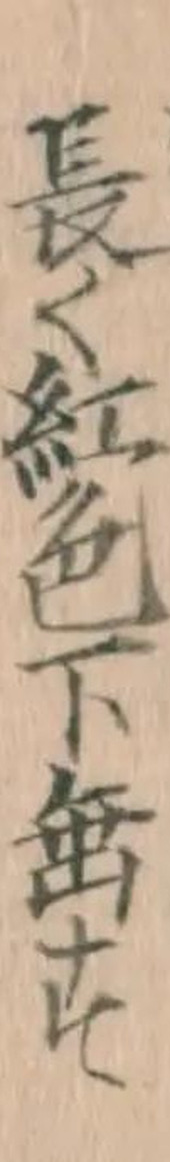長く紅色下垂す

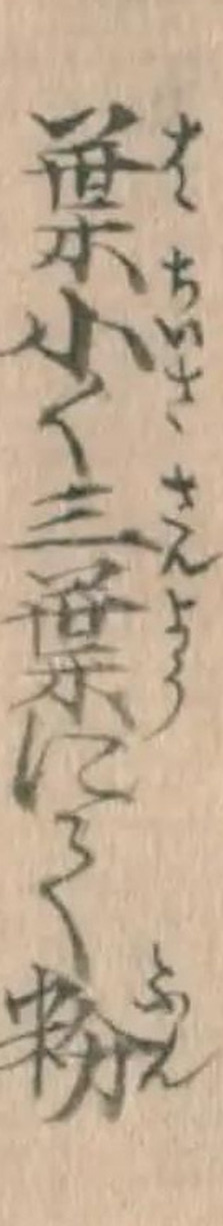葉小く三葉にて粉
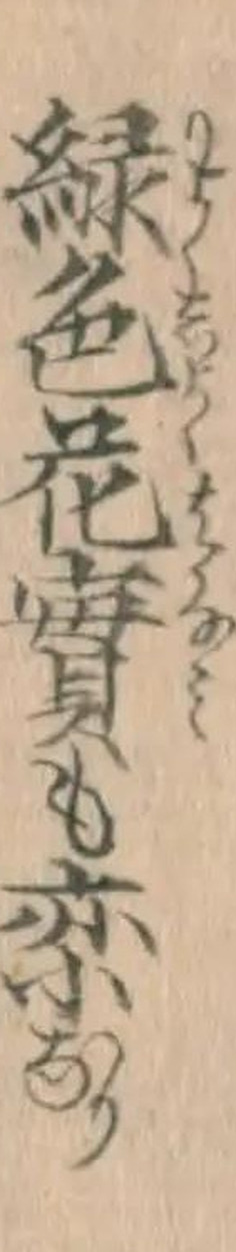緑色花実も亦小なり
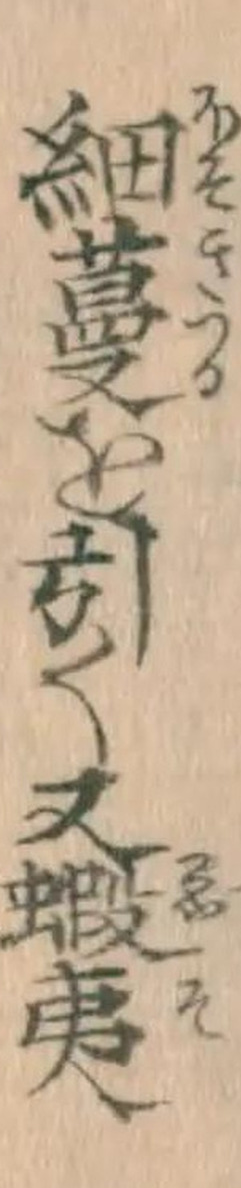細蔓を引く又蝦夷
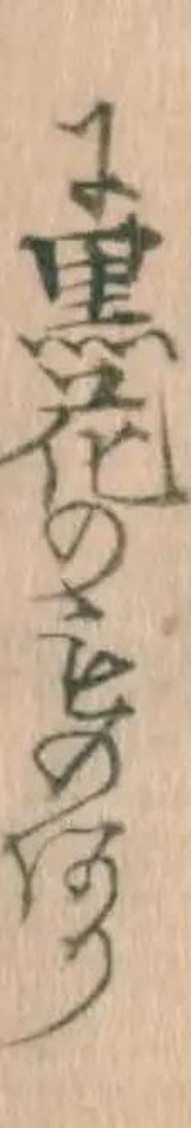に黒花のものあり
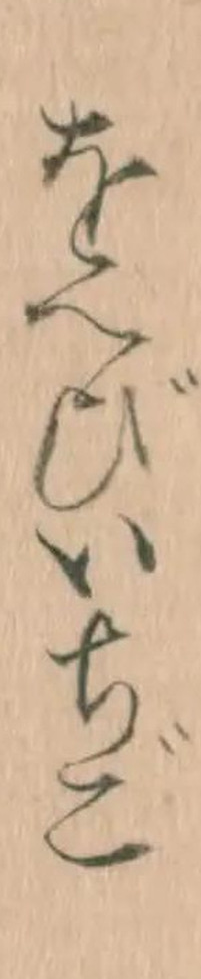をへひいちこ
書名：本草図譜. 巻25-27
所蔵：国立国会図書館 National Diet Library, JAPAN
